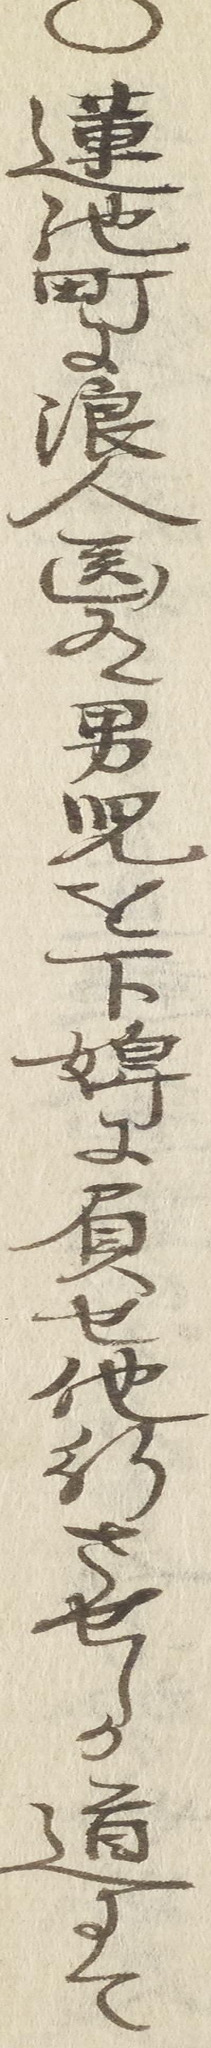○蓮池町に浪人医有男児を下婢に負せ他行させしか道にて
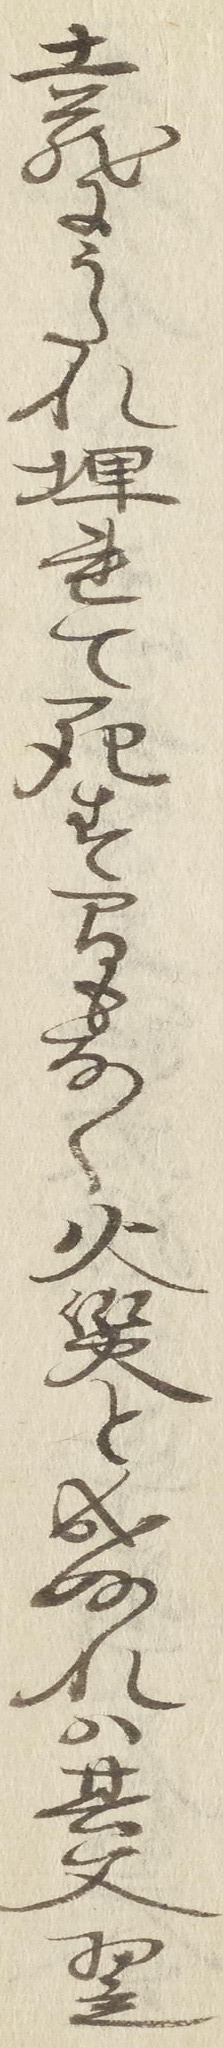土蔵にうたれ埋れて死す間もなく火災と成給れは其父翌
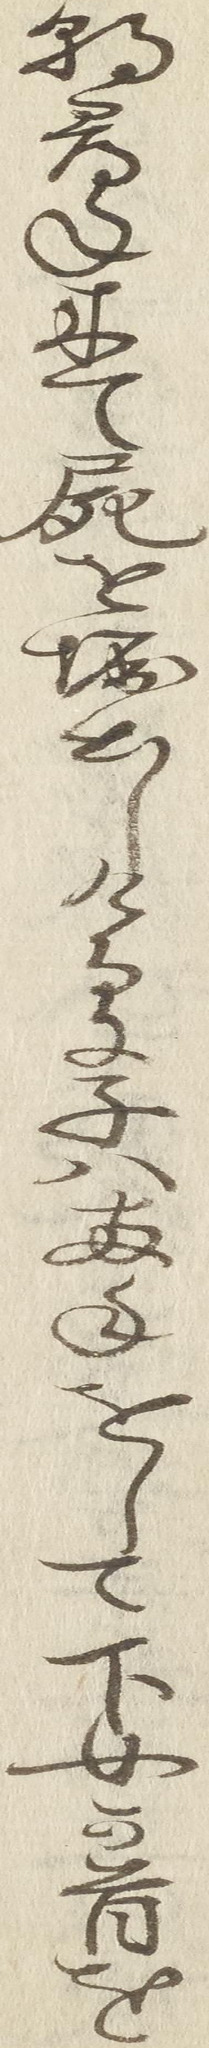朝尋ね来て屍を掘出しけるに子は両手をして下女か首を
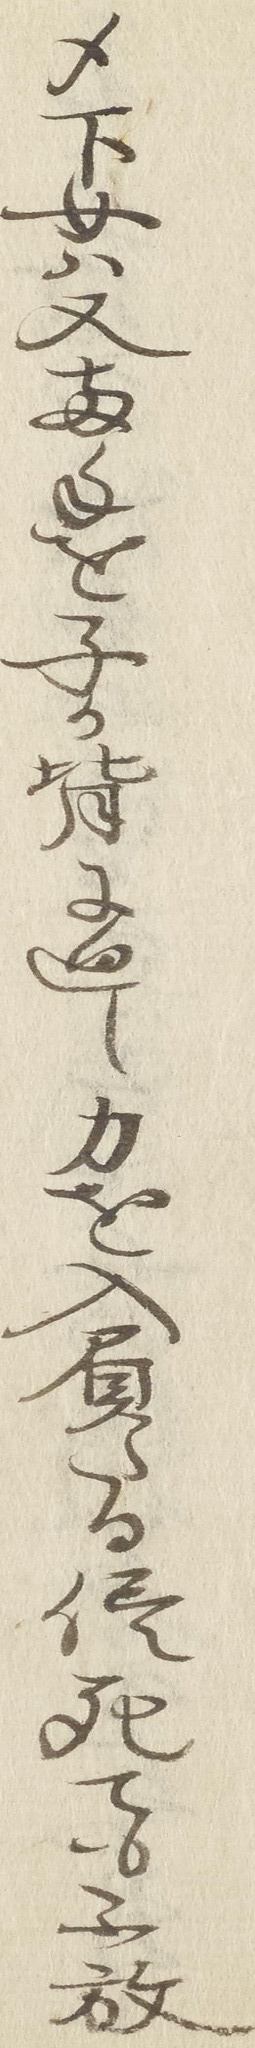〆下女は又両手を子か背に廻し力を入負たる侭死ても不放
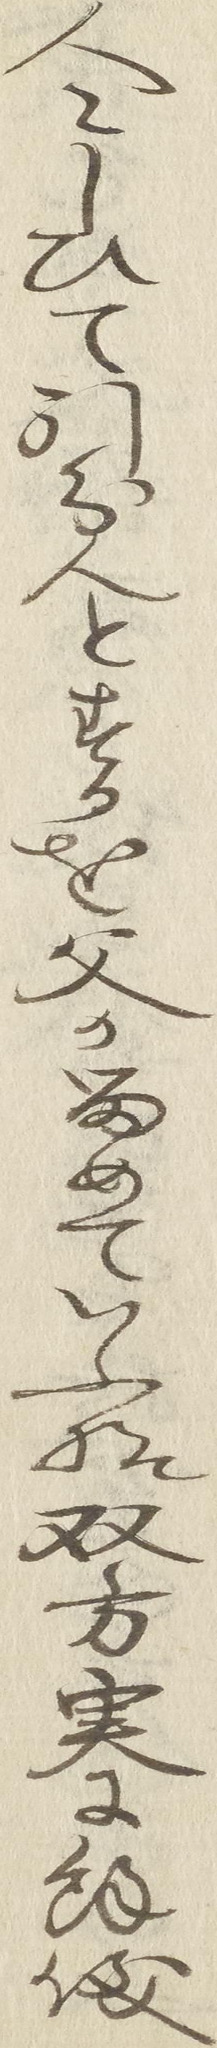人々しひて引分人とするを父か留めていふ将ニ双方実に余儀
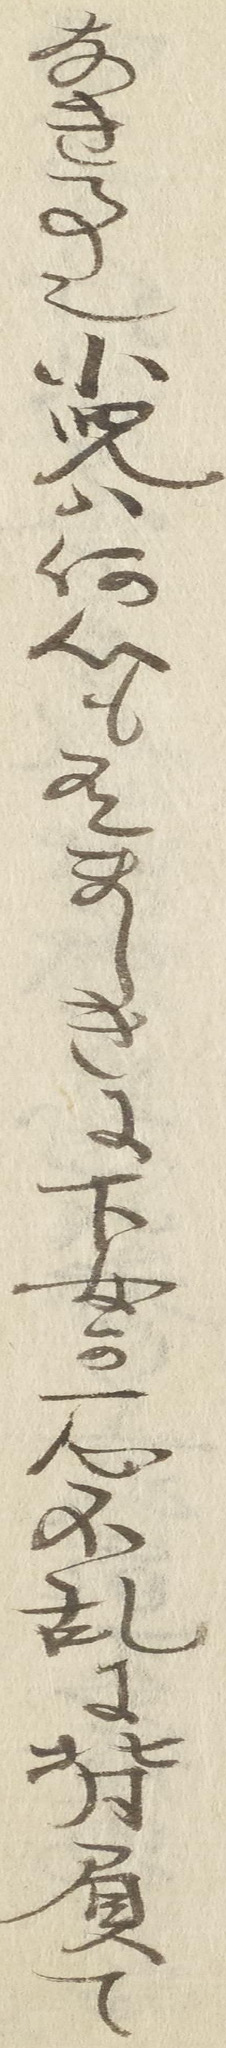なき事也小児は何心も有ましきに下女か一心不乱に背負て
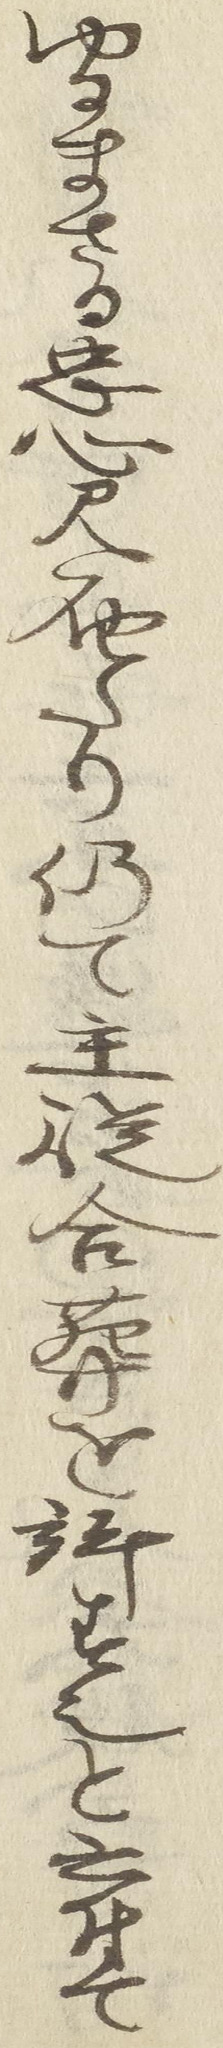ゆるまさる忠心見届たり仍て主従合葬を評す也と云付て
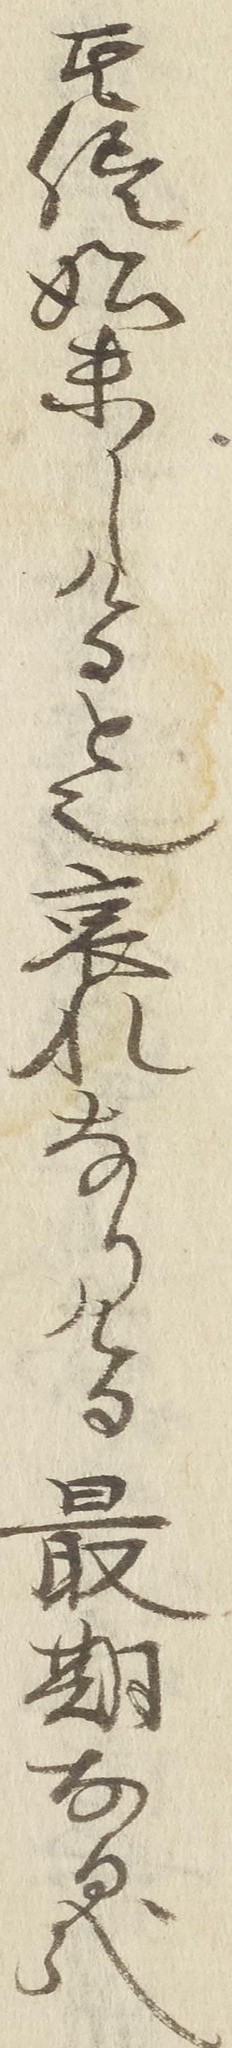其侭始末しけると也哀れなりける最期なる哉

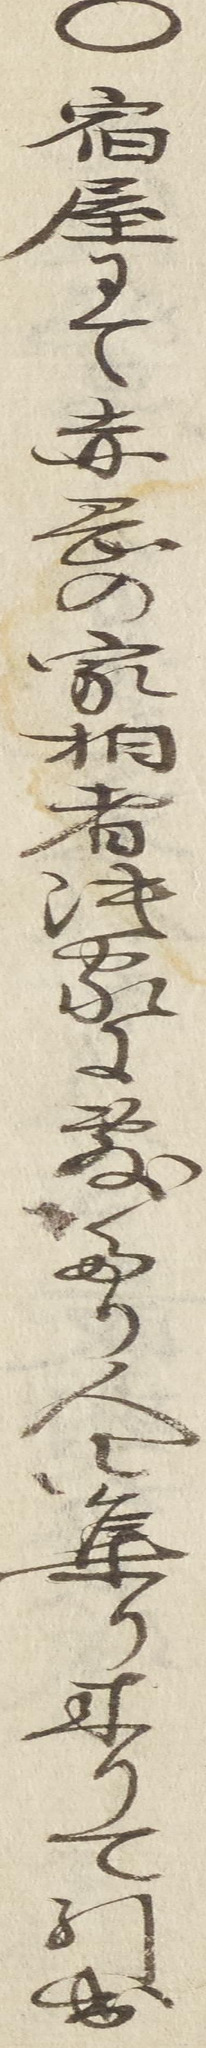〇宿屋にて赤岡の家相者潰家に敷たり人々集り来りて引出
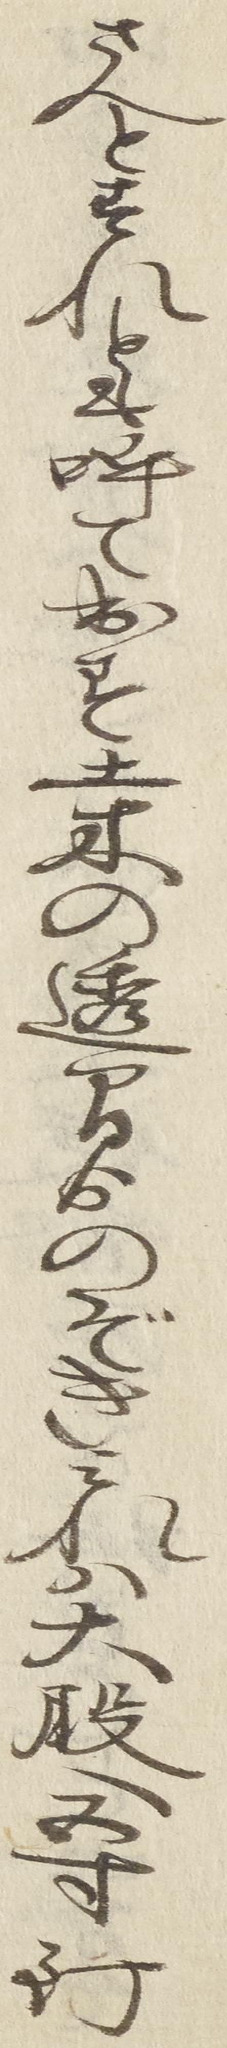さんとすれとも呼て出す土木の隙透間よりのぞきみれは大股へ五寸釘
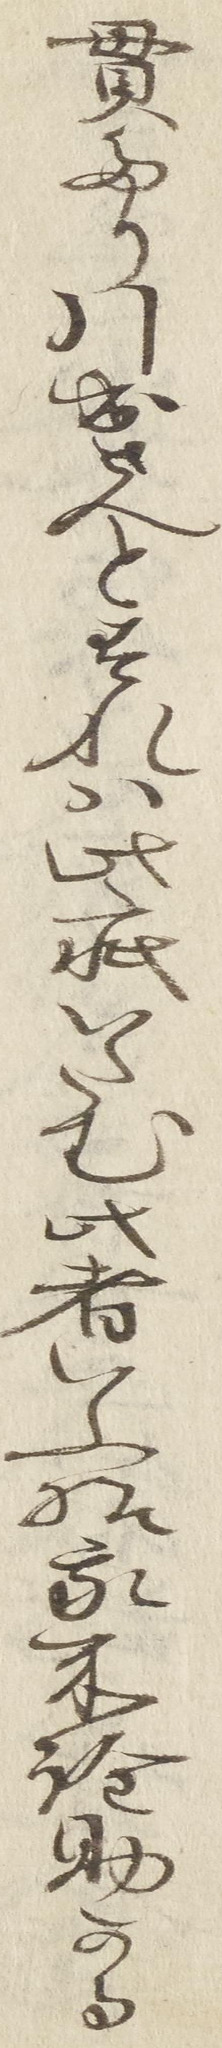貫たり引出さんとすれは此疵いたむ此者いふ様我所詮助かる
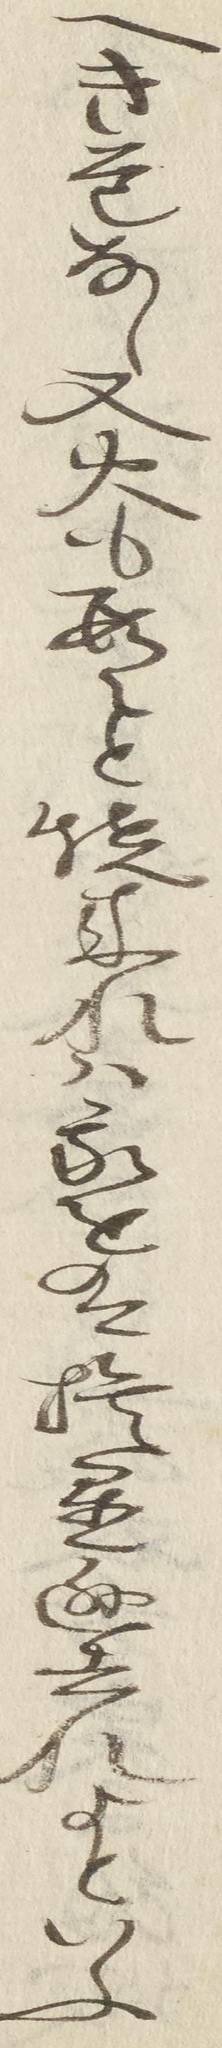へき道なし又火も段々と焼来れは我をのみ捨置逃去れよといふ
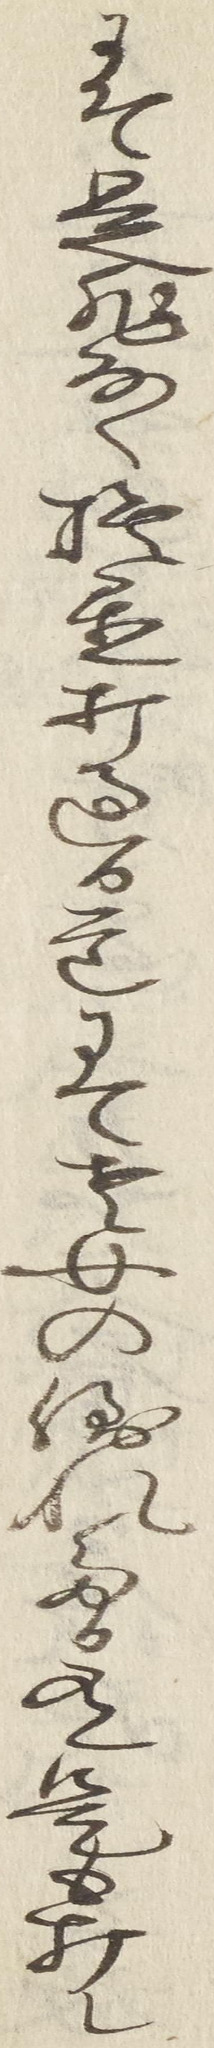にて是非なく捨置打過る道にて老女の倒れたる有是も打し
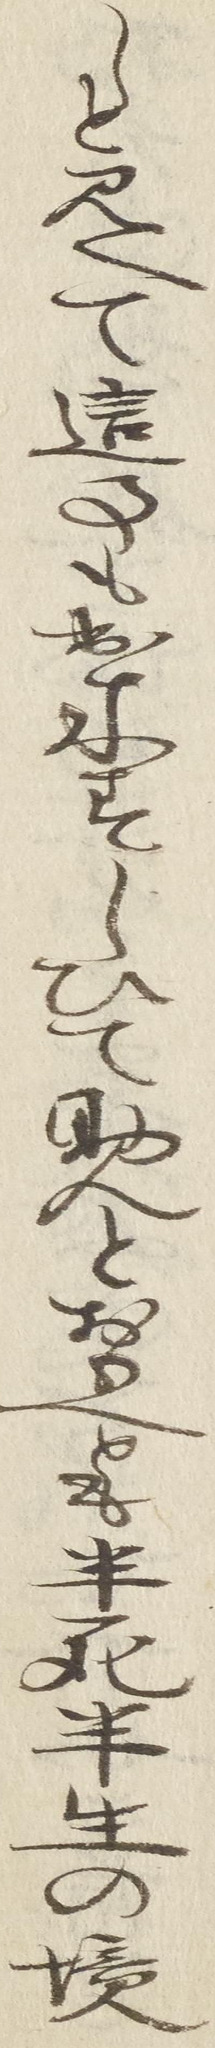しと見へて這事も出来すしひて助んとおもへとも半死半生の境
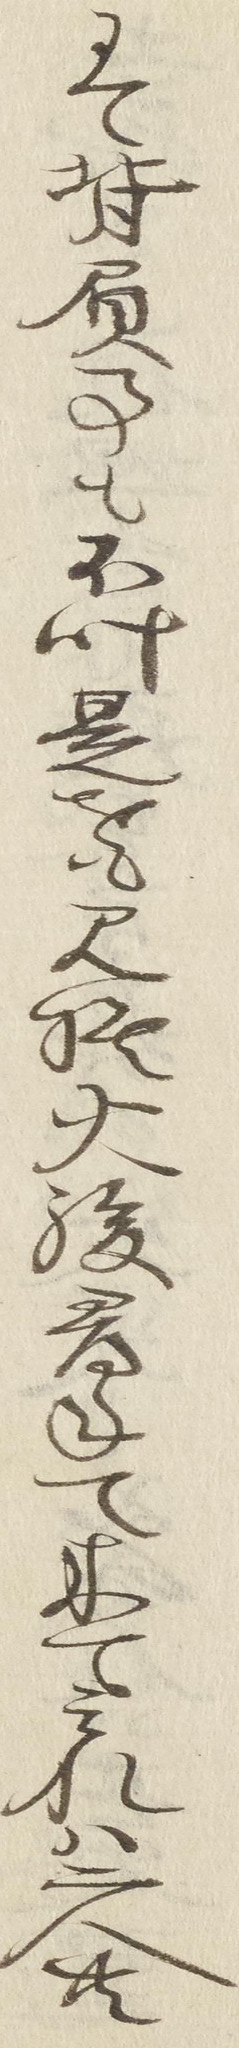にて背負事も不叶是をも見捨火後尋ねて来てみれは二人共
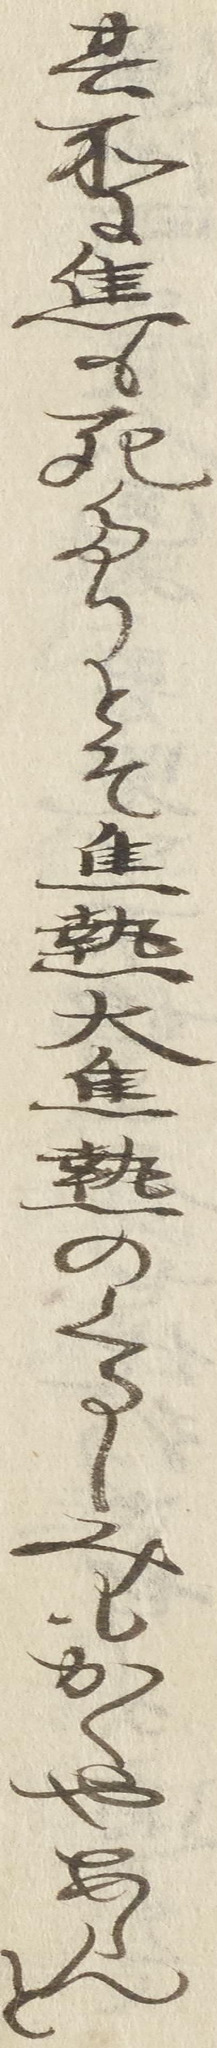其所に焦も死たりとそ焦熱大焦熱のくるしみもかくやあらんと
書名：地震記　上
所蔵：東京大学地震研究所図書室 Earthquake Research Institute Library, The University of Tokyo, JAPAN
